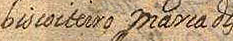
biscoiteiro maria dis
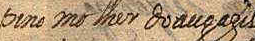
pino molher do augazil
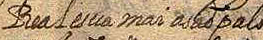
Real e sua mai a saõ palo
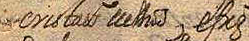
cristais uelhos, e frz̄
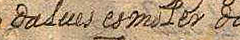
dalues esmoler do
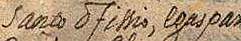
santo ofissio, e gaspar
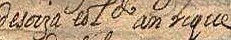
de soiza e o ldo anrique
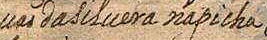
uas da siluera na picha
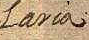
Laria
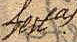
testas.
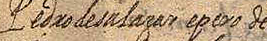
Pedro de salazar e pero de
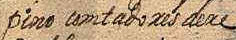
pino comtadores de re
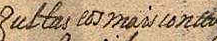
zultas e os mais contta
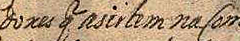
dores q̄ asistem na Com
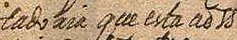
tadoria que esta aoss
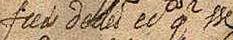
fiess de des̄ e cto q̄ sse
